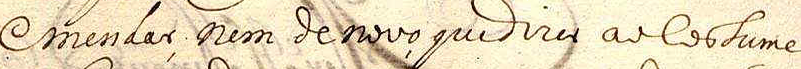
emendar, nem de novo, que dizer ao Costume
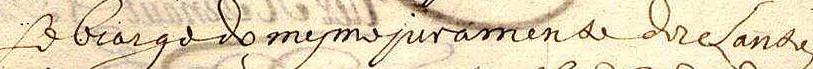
sob cargo do mesmo juramento dos santos
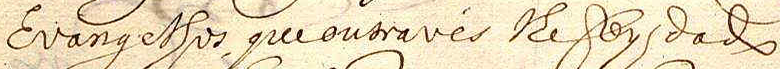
Evangelhos, que outra vés lhe foy dado
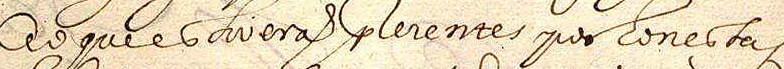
ao que estiveraõ pRezentes por honestas
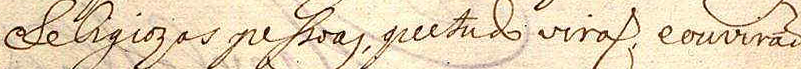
e Religiozas pessoas, que tudo viraõ, e ouviraõ
